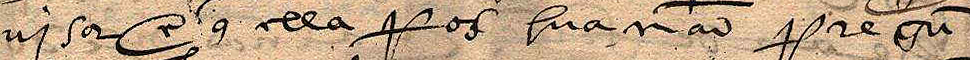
ujsor ē q̄ ella pos sua mão pregū
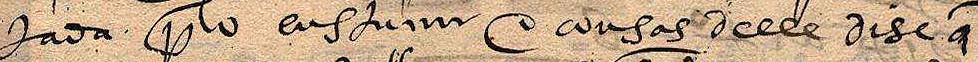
tada p̄lo custume e cousas delle dise q̄
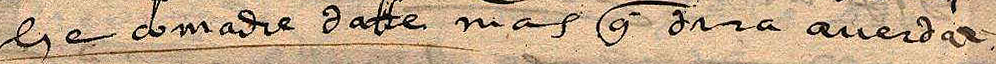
he comadre da Re mas q̄ dira a uerdade
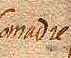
Comadre
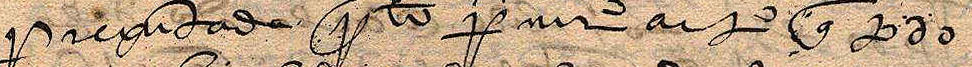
Pregūtada p̄lo p̄mro arto q̄ todo
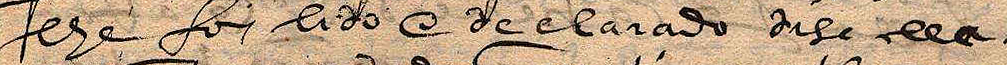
lhe foy lido e declarado dise ella
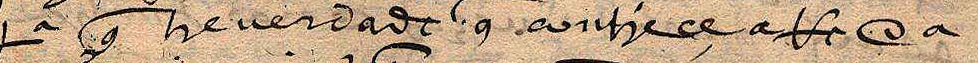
ta q̄ he uerdade q̄ conheçe a Re e a
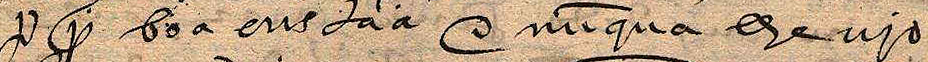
tē p̄o boa cristaā e nūqua lhe ujo
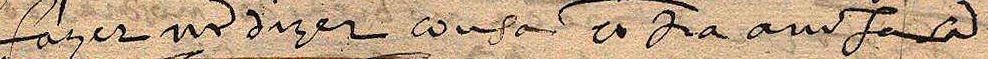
fazer nē dizer cousa c̄otra a nosa sā
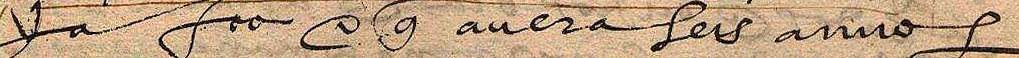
ta see e q̄ auera seis annos
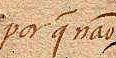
porq̄ não
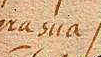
era sua
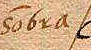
sōbra
